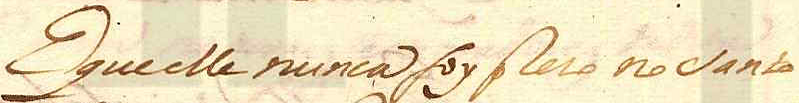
E que elle nunca foy pRezo no santo
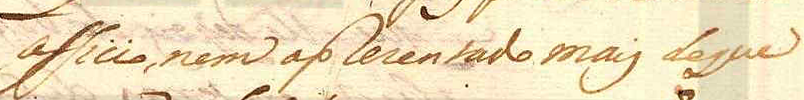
officio, nem apRezentado mais do que
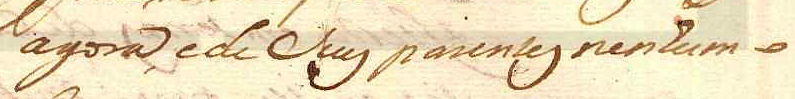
agora, e de seus parentes nenhum o
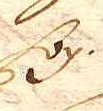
foy.
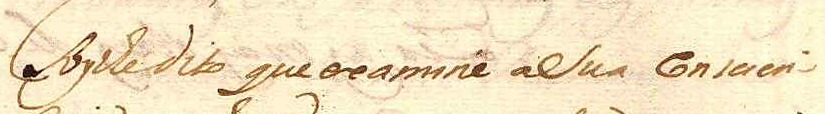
Foylhe dito que examine a sua conscien
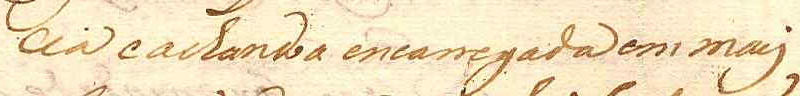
cia, e achandoa encarregada em mais
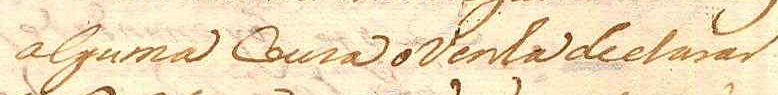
alguma couza o venha declarar
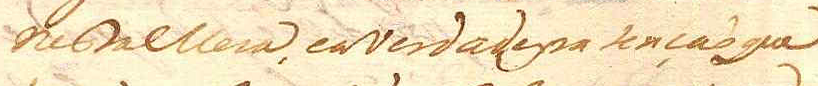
nesta Meza, e a verdadeyra tençaõ que
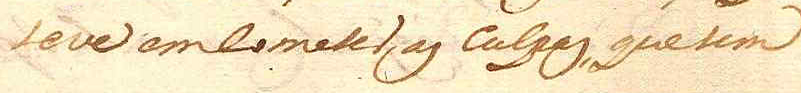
teve em cometer as culpas, que tem
